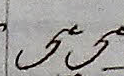55
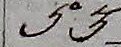53
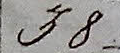38
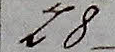28
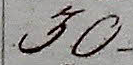30
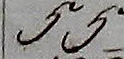55
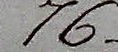76
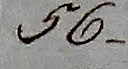56
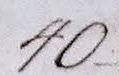40
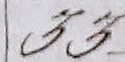33
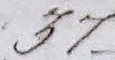37
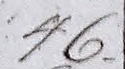46
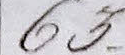63
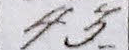43
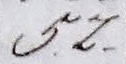52
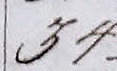34
